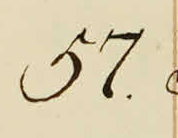57.
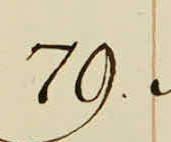79.
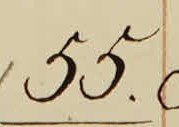55.
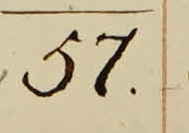57.
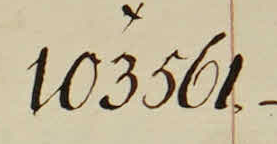103561.
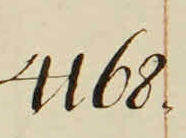4168
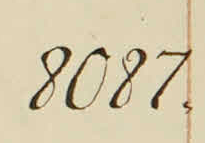8087
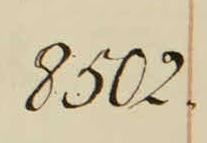8502
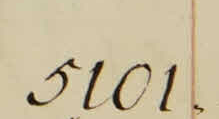5101
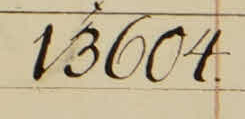13604.
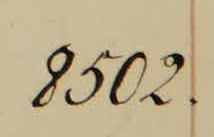8502
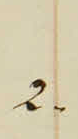2
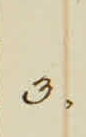3
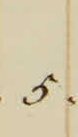5
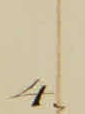4
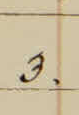3
